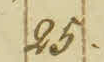25
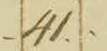41.
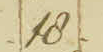18
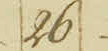26
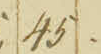45
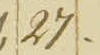27
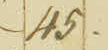45
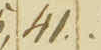41.
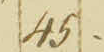45
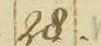28
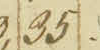35
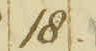18
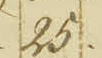25
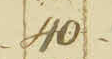40
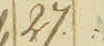27.
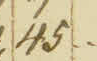45
